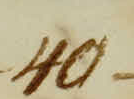40
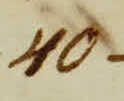40
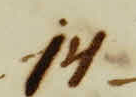14
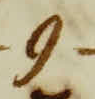9
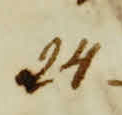24
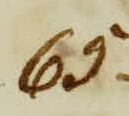65
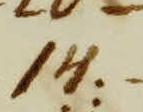14.
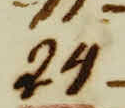24
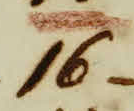16
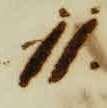11
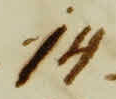14
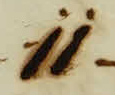11
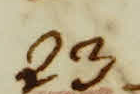23
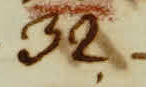32
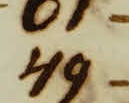49
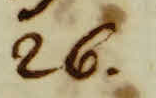26.
